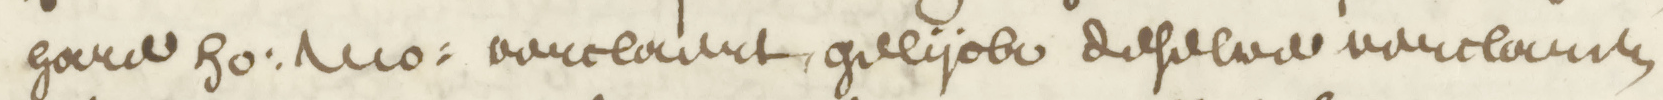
hare ho:mo verclaert, gelijck deselve verclaren
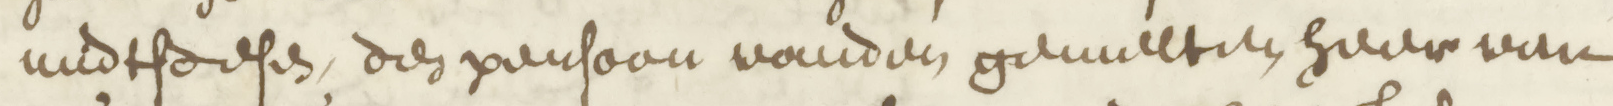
midtsdesen, den persoon vanden gemelten heer van
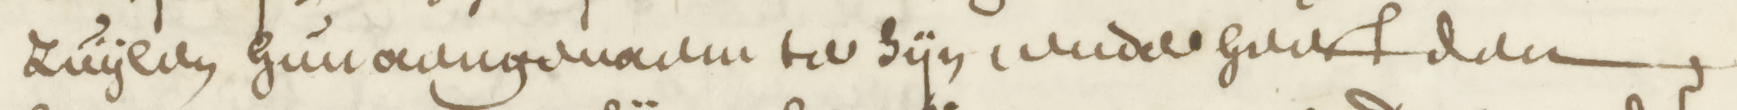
Zuijlen hun aengenaem te sijn, ende heeft den
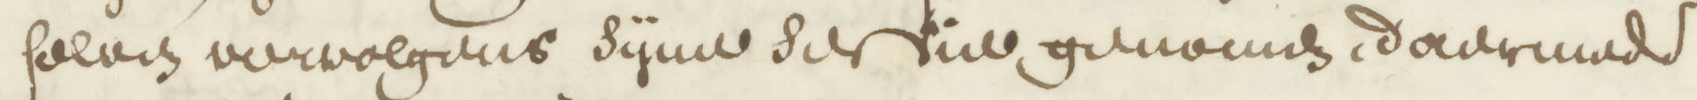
selven vervolgens sijne sessie genomen, daermede
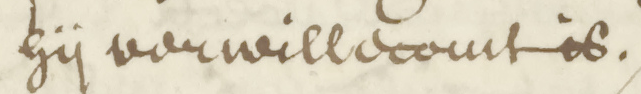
hij verwillecomt is.
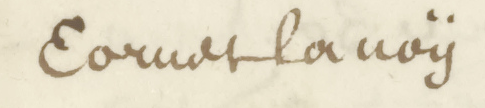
Cornet la noij
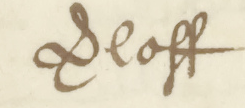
Vloff
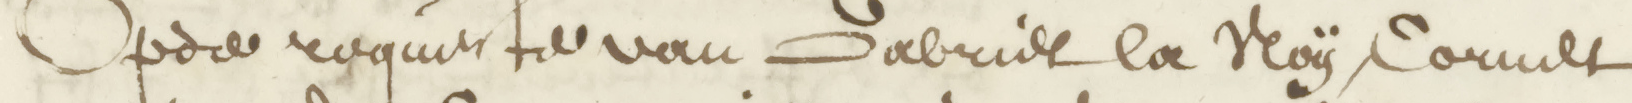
Opde requeste van Gabriel la Noij, Cornet
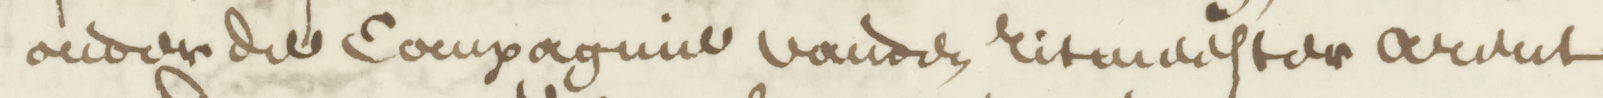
onder de Compagnie vanden ritmeester Arent
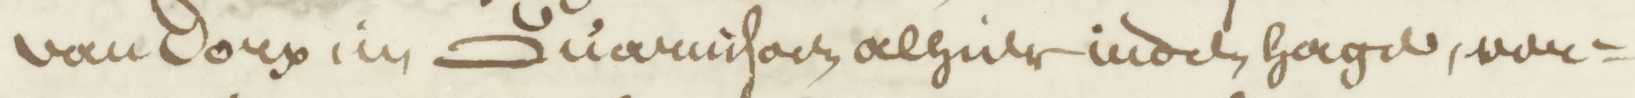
van Dorp in Guarnisoen alhier inden hage, ver=
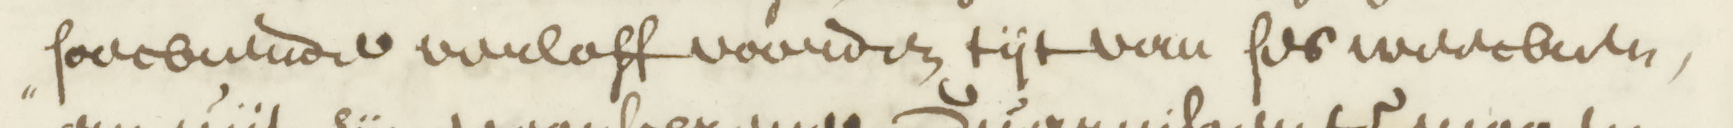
„soeckende verloff voorden tijt van ses weecken,
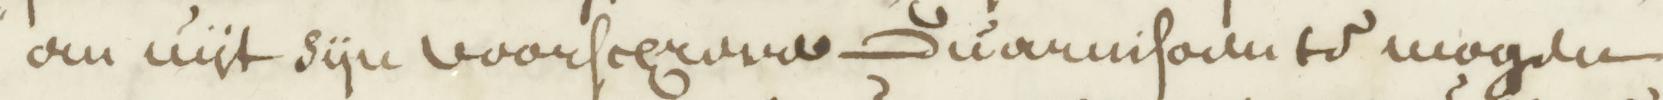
om uijt sijn voorschreve Guarnisoen te mogen
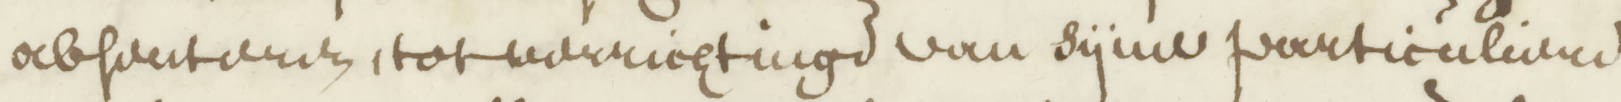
absenteren, tot verrichtinge van sijne particuliere
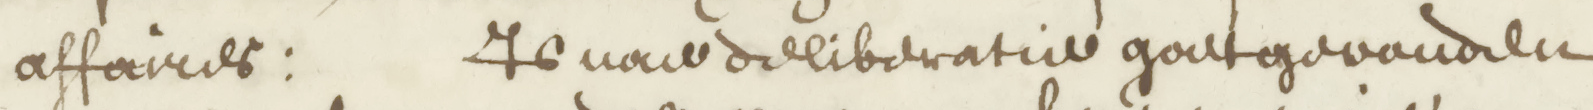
affaires: Is nae deliberatie goetgevonden
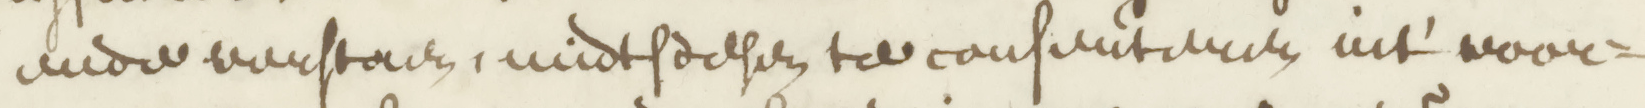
ende verstaen, midtsdesen te consenteren int' voor=
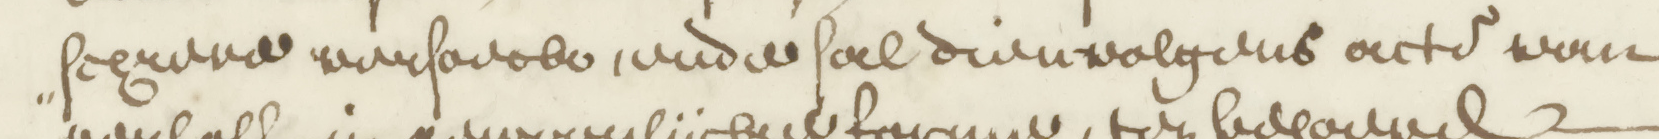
„schreve versoeck, ende sal dienvolgens acte van
